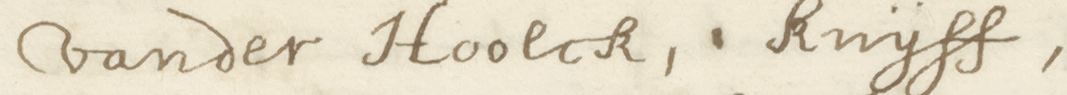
vander Hoolck, Knijff,
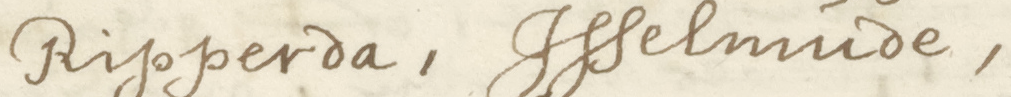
Ripperda, Isselmude,
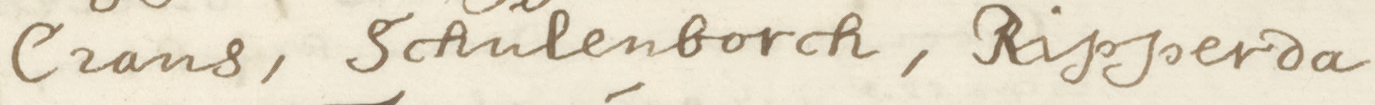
Crans, Schulenborch, Ripperda
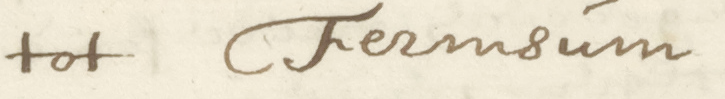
tot Fermsum.
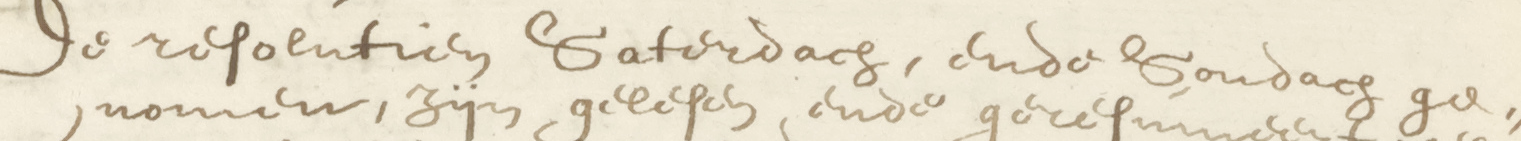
De resolutien Saterdach, ende Sondach ge„
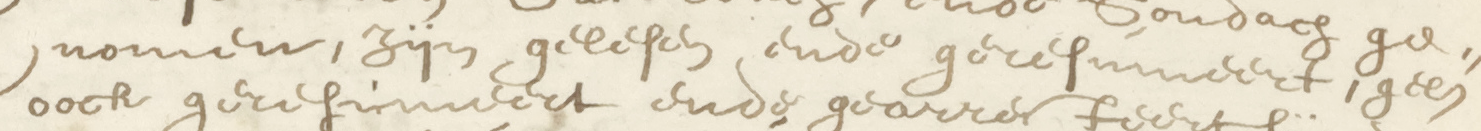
nomen, zijn gelesen ende geresumeert, gel
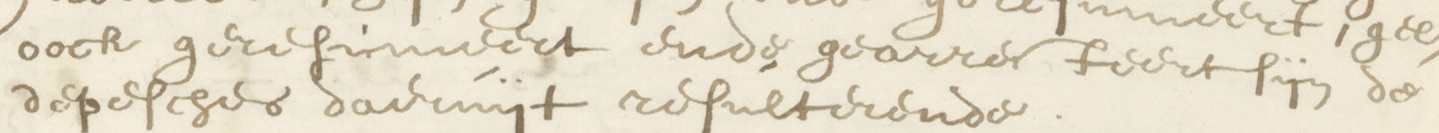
oock geresumeert ende gearresteert sijn de
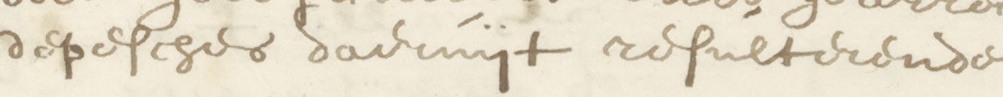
depesches daeruijt resulterende.
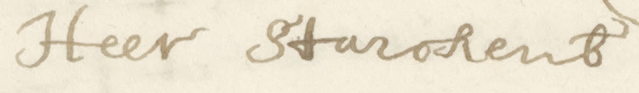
Heer Starckenb
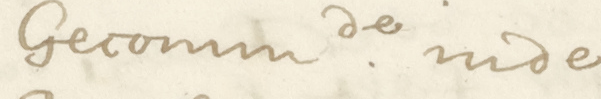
Gecommde inde
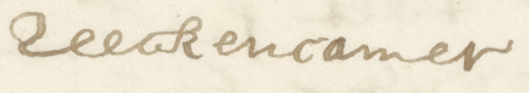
Reeckencamer.
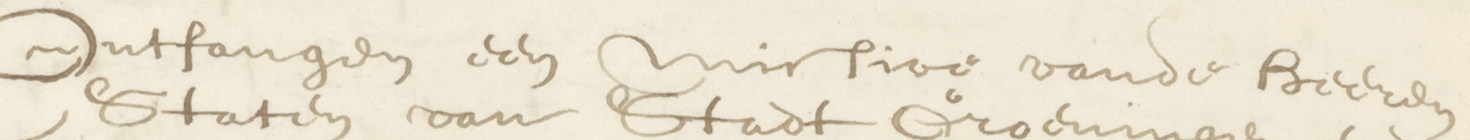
Ontfangen een Missive vande Heeren
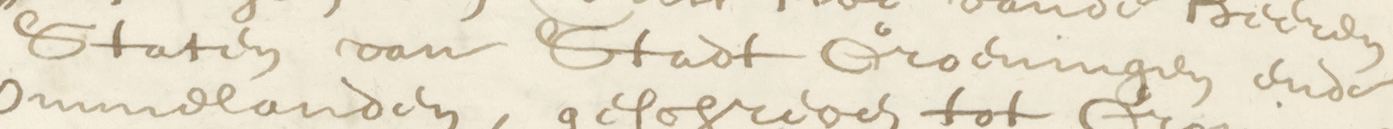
Staten van Stadt Groeningen ende
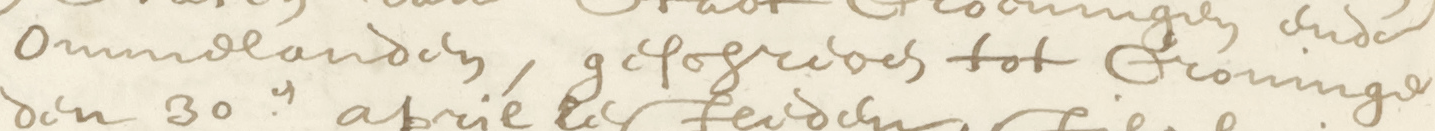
Ommelanden, geschreven tot Groninge
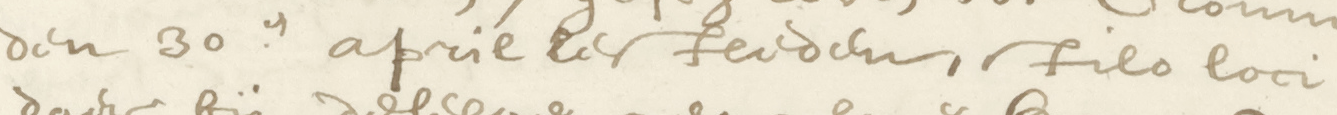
den 30en. april lestleden, stilo loci,
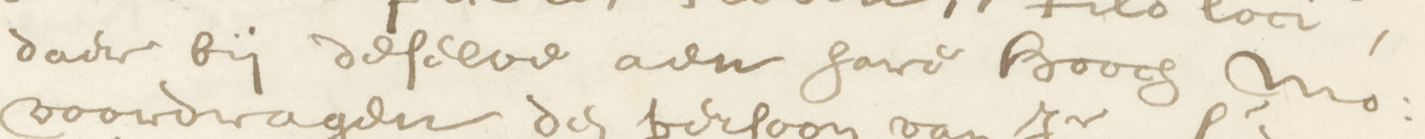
daer bij deselve aen hare Hooch Mo:
